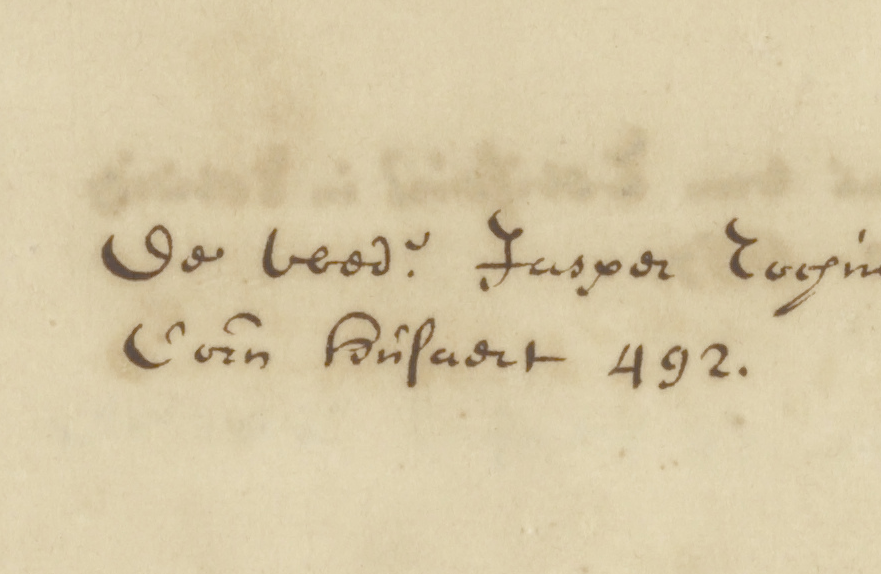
Corn Husaert 492.
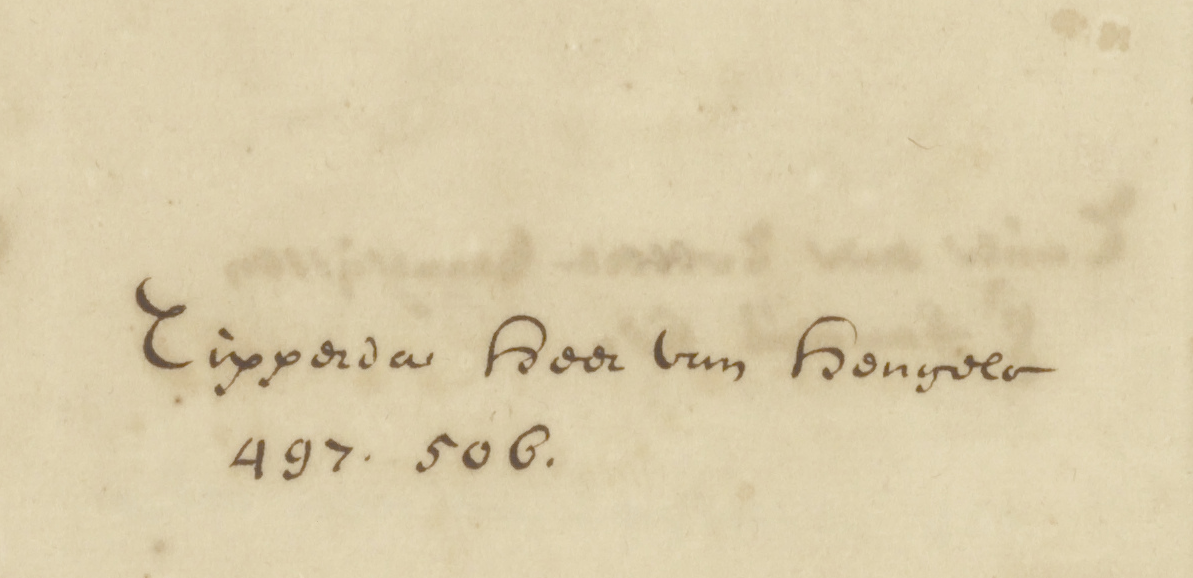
Ripperda heer van Hengelo
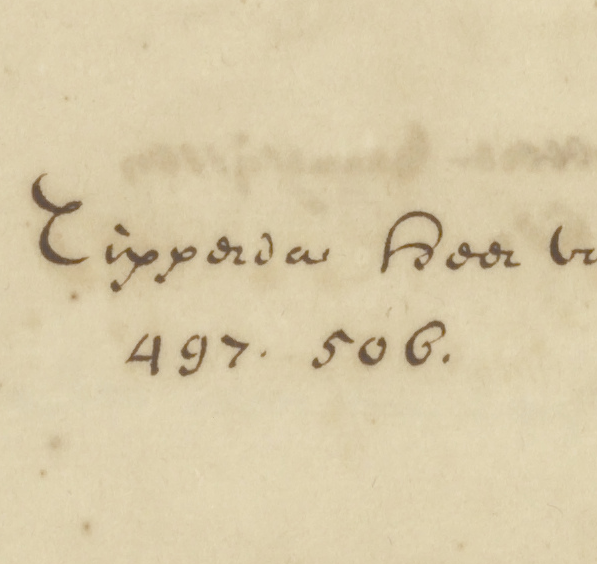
497, 506.
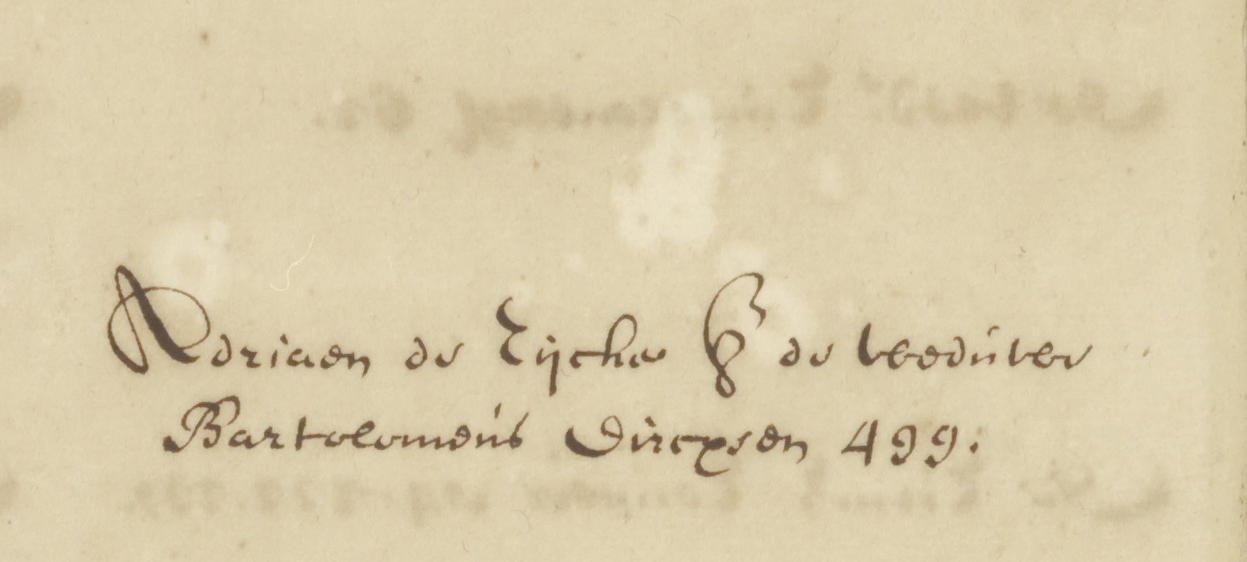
Adriaen de Rijcke ca. de weduwe
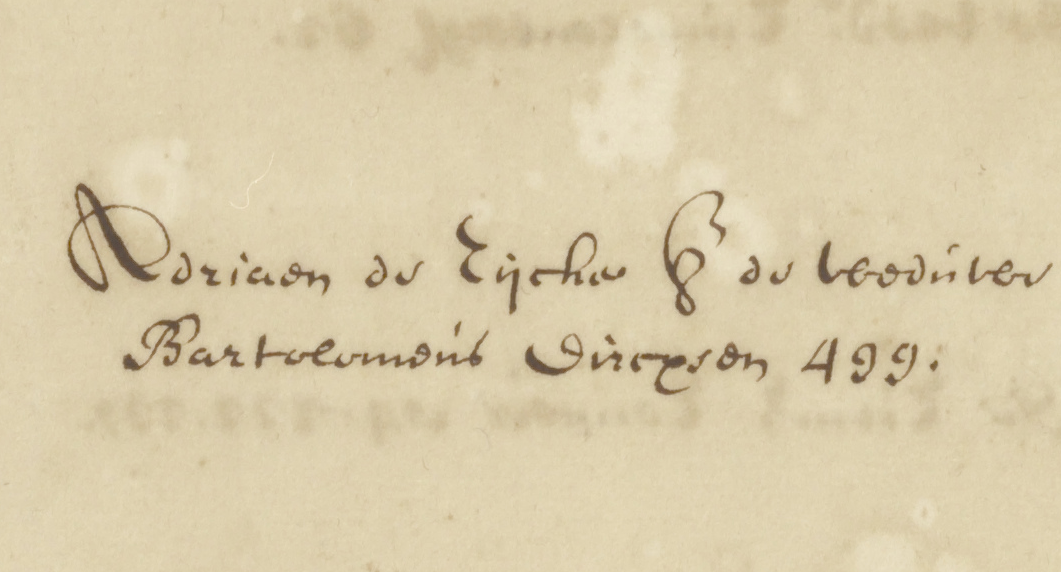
Bartolomeus Dircxsen 499.
